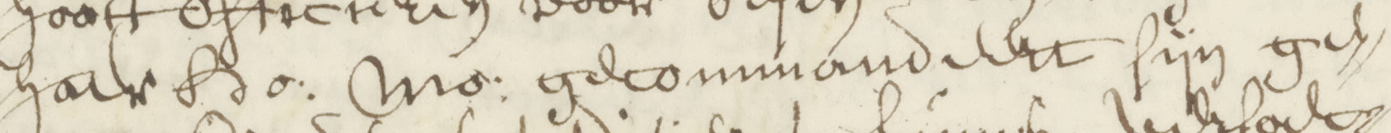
haer Ho:Mo: gecommandeert sijn ge,,
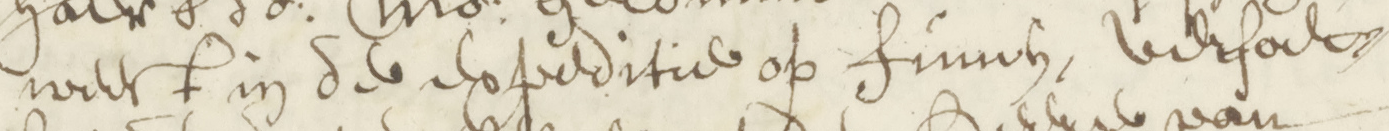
weest in de expeditie op Funen, versoec„
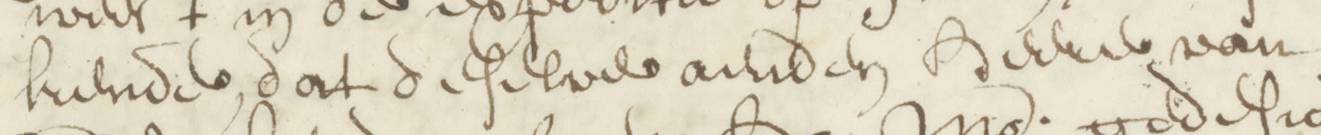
kende, dat deselve aenden Heere van
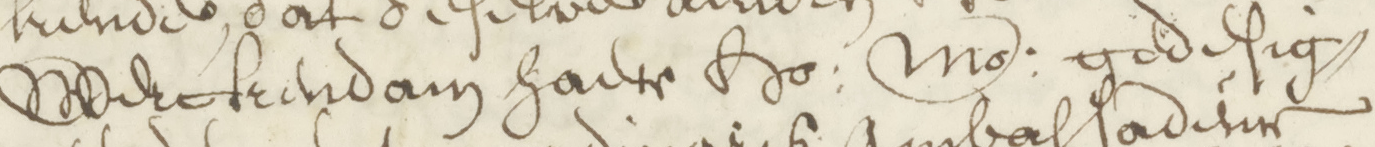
Werckendam haer Ho:Mo: gedesig,,
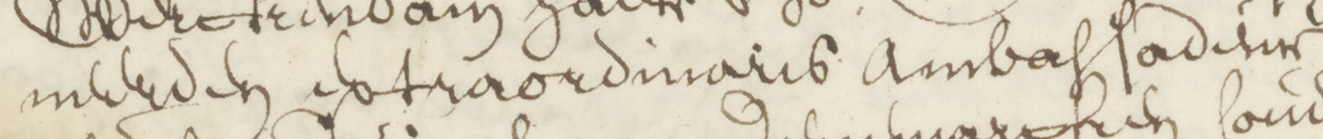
neerden extraordinaris Ambassadeur
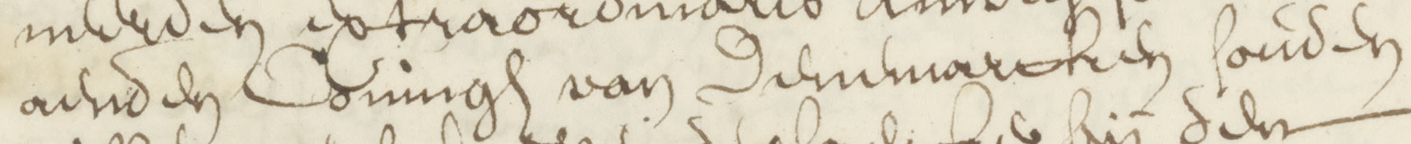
aenden Coningh van Denemarcken souden
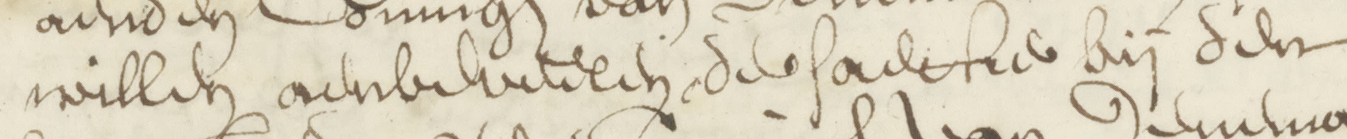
willen aenbeveelen, de saecke bij den
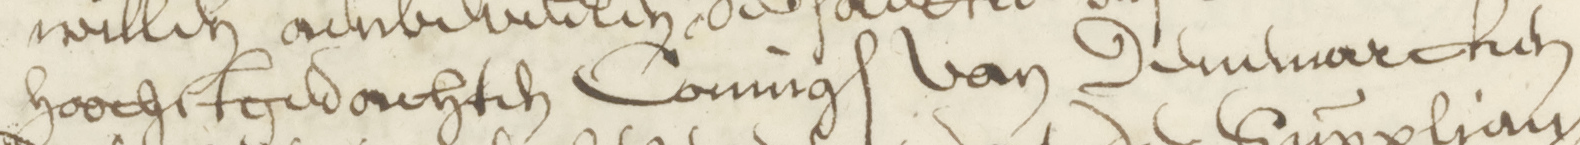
hoochstgedachten Coningh van Denemarcken
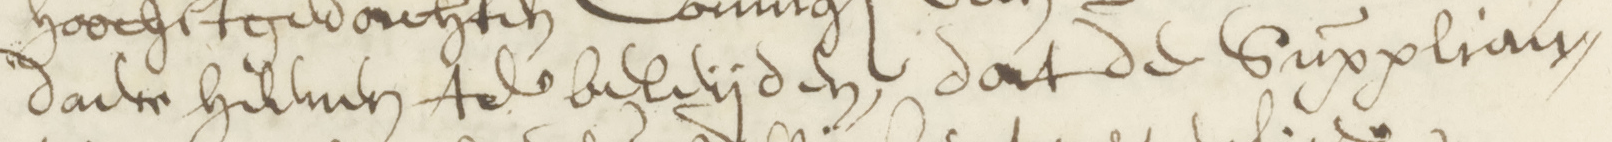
daer heenen te beleijden, dat de Supplian„
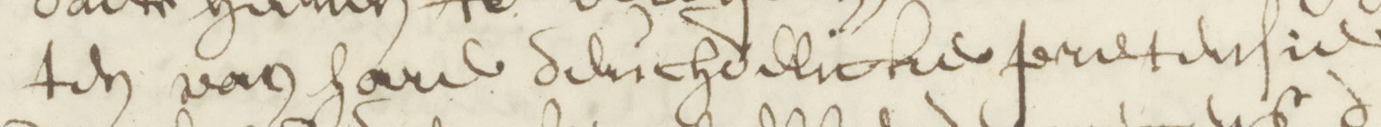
ten van hare deuchdelicke pretensie
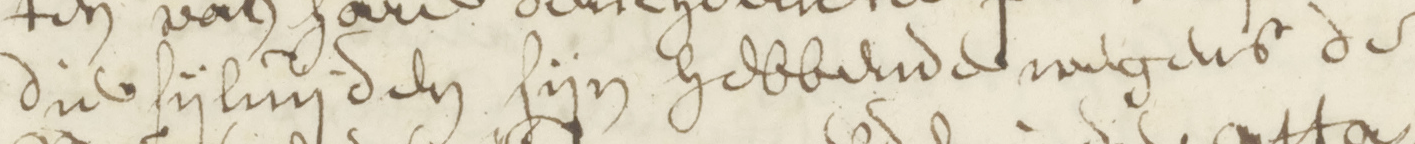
die sijluijden sijn hebbende wegens de
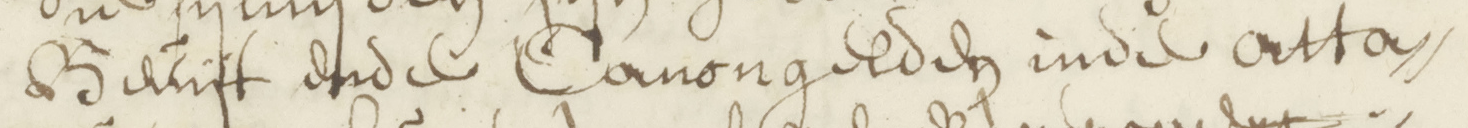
Beuijt ende Canongelden inde atta„
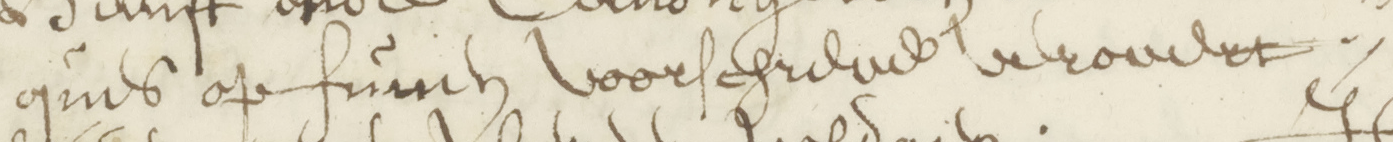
ques op Funen voorschreve verovert;
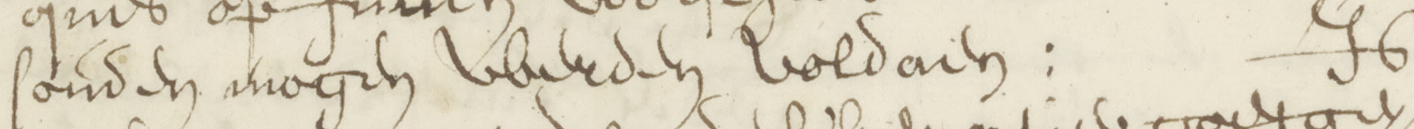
souden mogen werden voldaen: Is
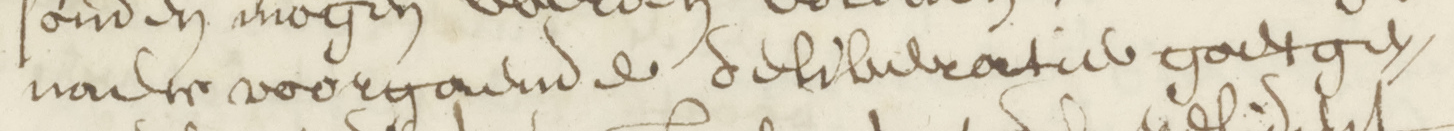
naer voorgaende deliberatie goetge„
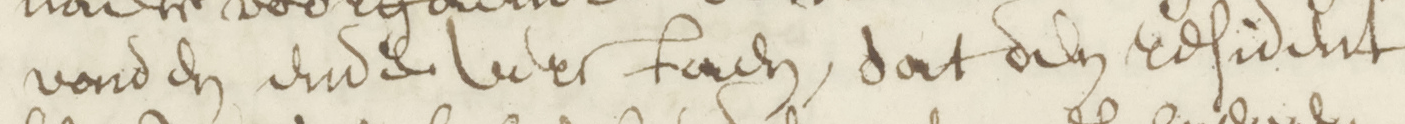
vonden ende verstaen, dat den resident
